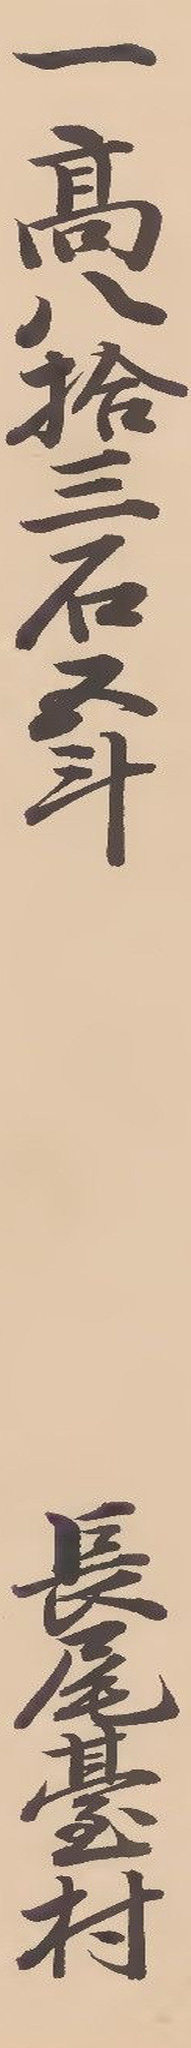一高八拾三石五斗長尾䑓村

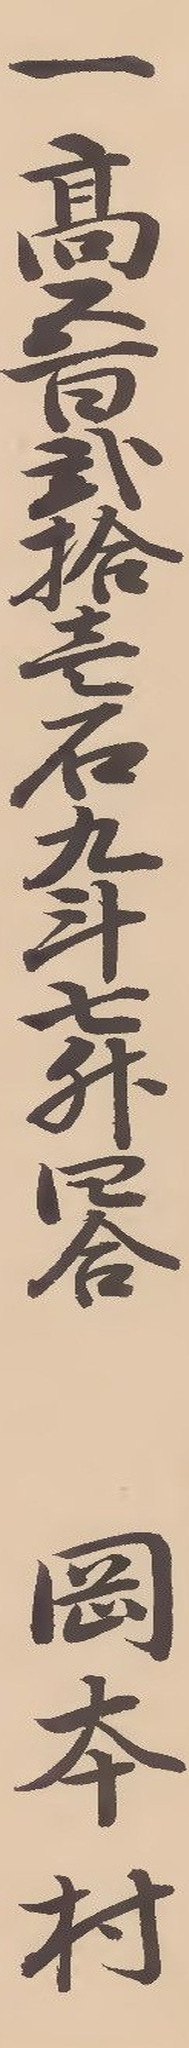一高五百弐拾壱石九斗七升四合岡本村
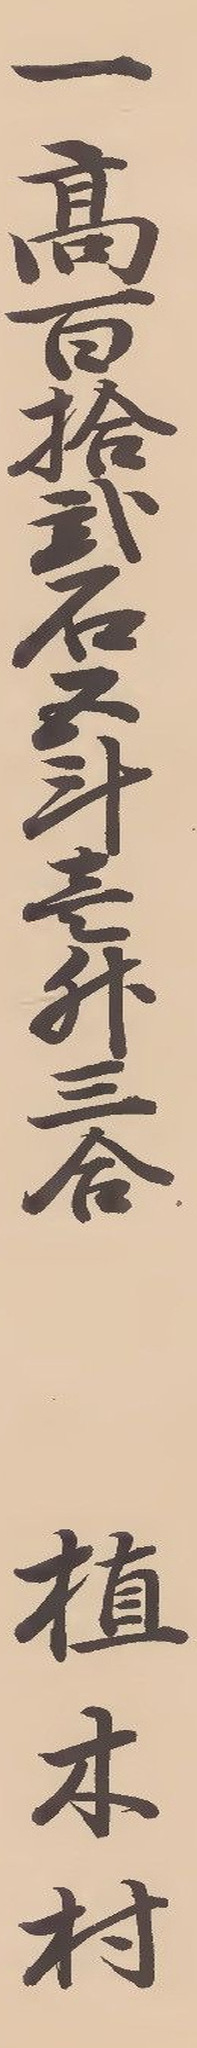一高百拾弐石五斗壱升三合植木村
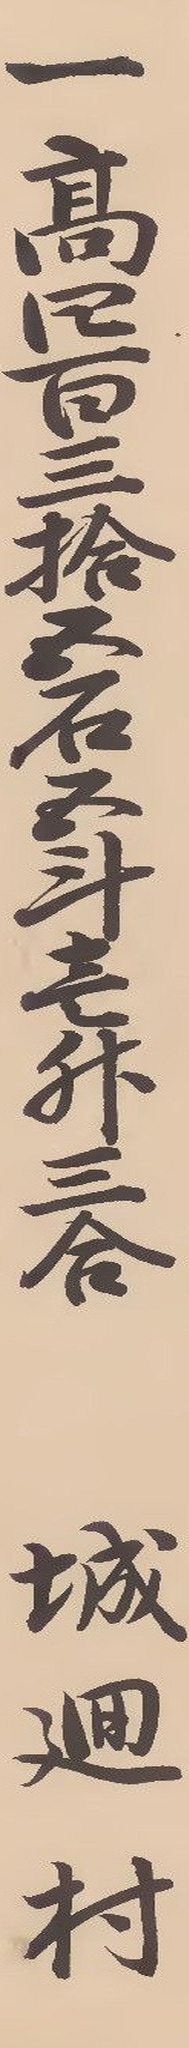一高四百三拾五石五斗壱升三合城廻村
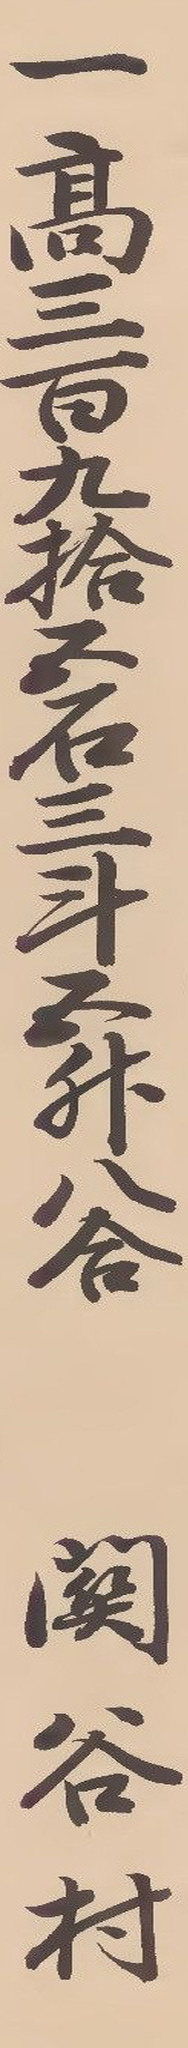一高三百九拾五石三斗五升八合関谷村
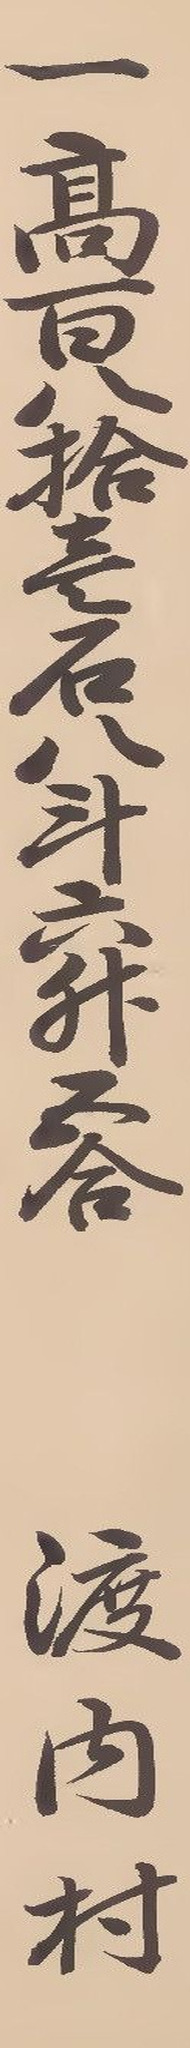一高百八拾壱石八斗六升五合渡内村
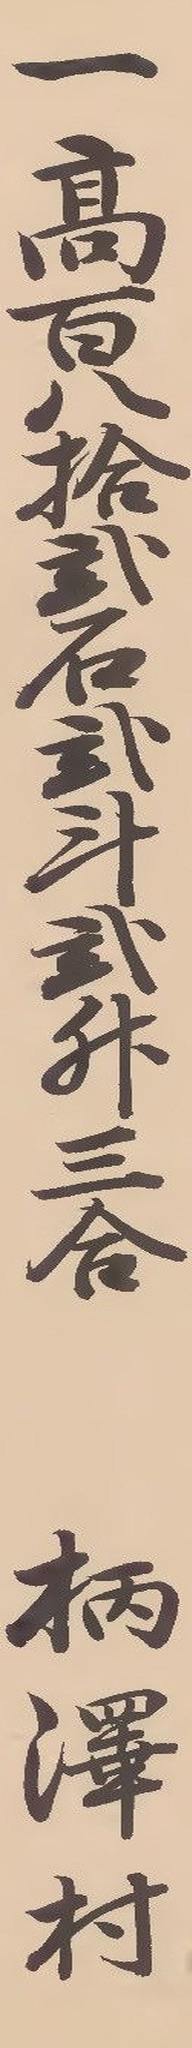一高百八拾弐石弐斗弐升三合柄澤村

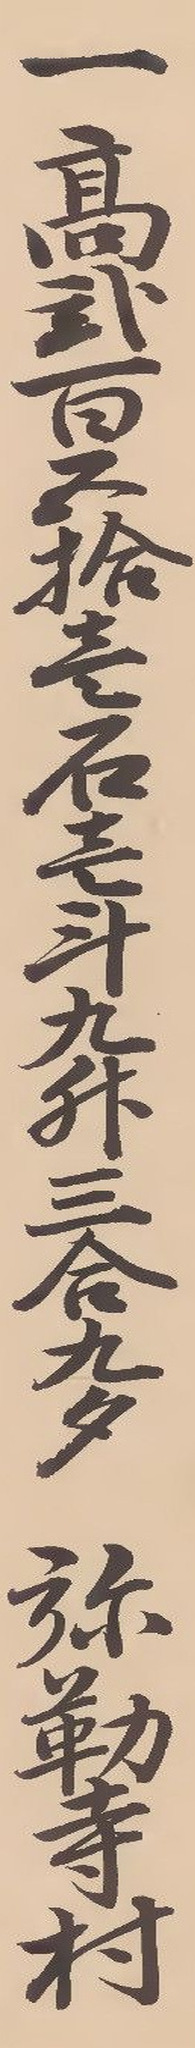一高弐百五拾壱石壱斗九升三合九勺弥勒寺村
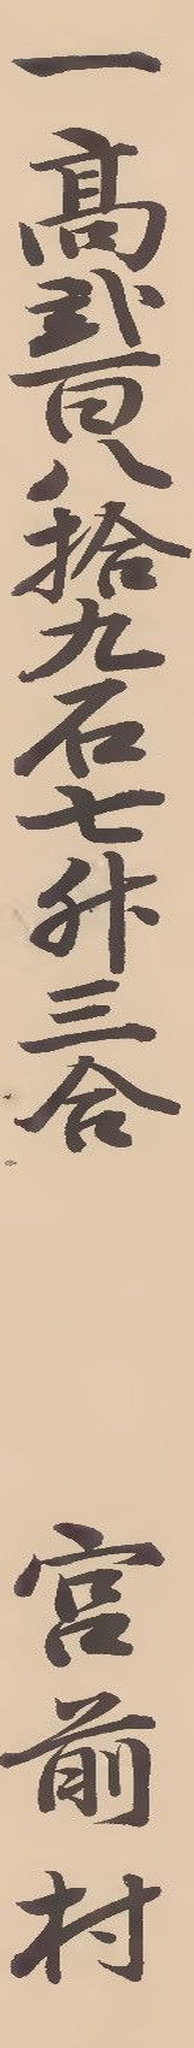一高弐百八拾九石七升三合宮前村
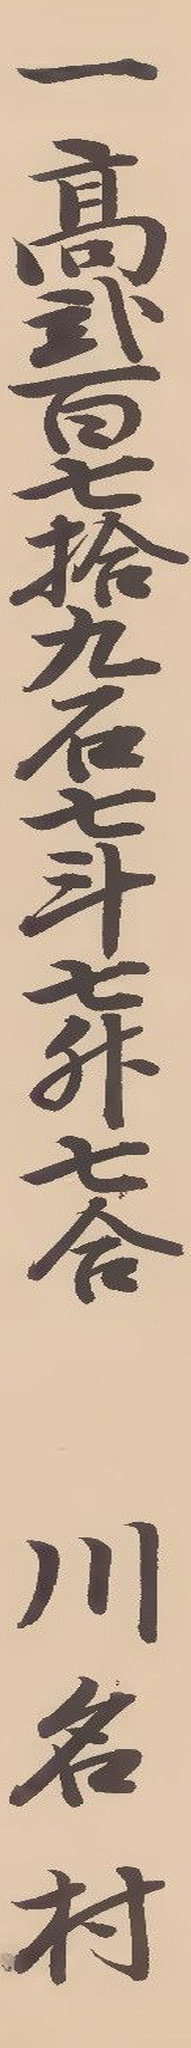一高弐百七拾九石七斗七升七合川名村
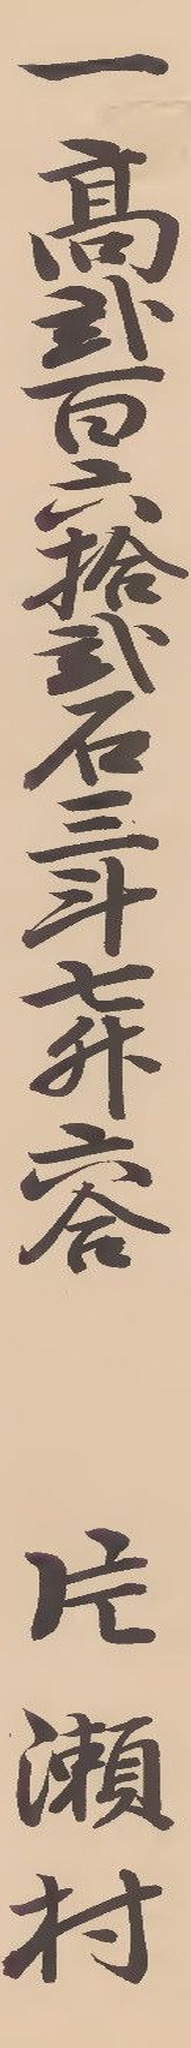一高弐百六拾弐石三斗七升六合片瀬村
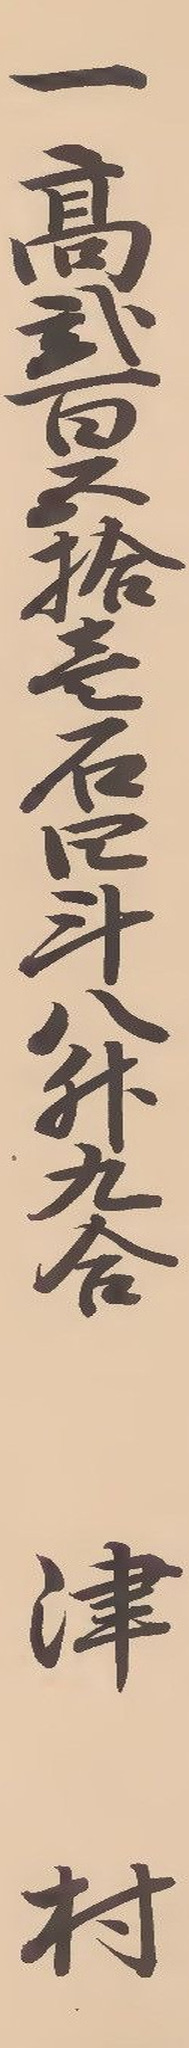一高弐百五拾壱石四斗八升九合津村
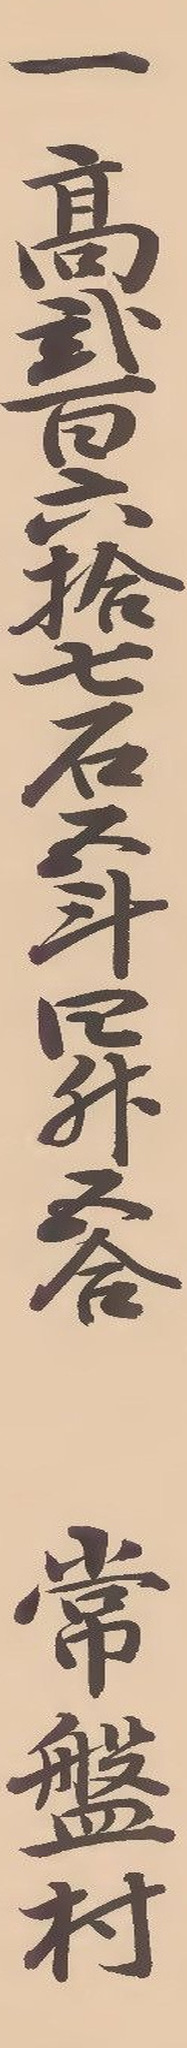一高弐百六拾七石五斗四升五合常盤村
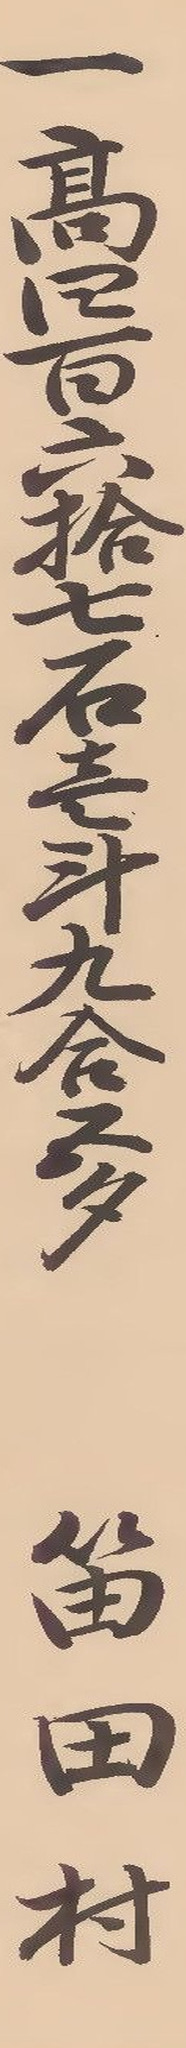一高四百六拾七石壱斗九合五勺笛田村

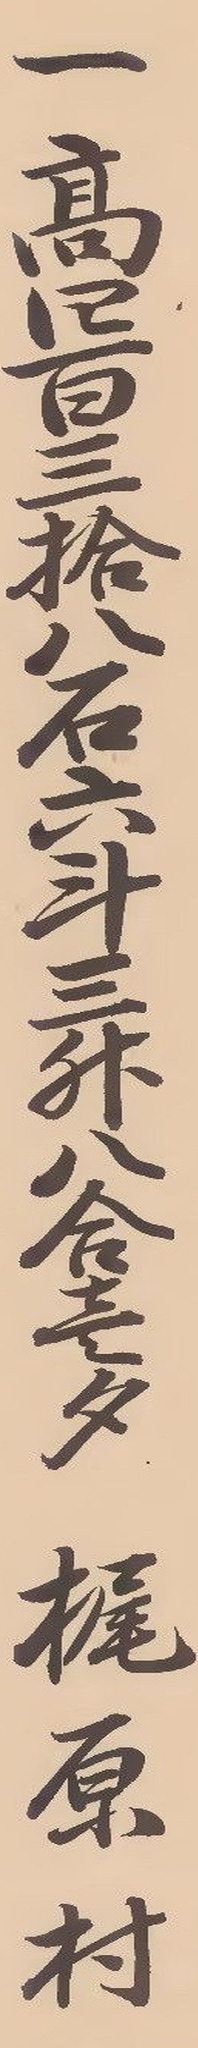一高四百三拾八石六斗三升八合壱勺梶原村
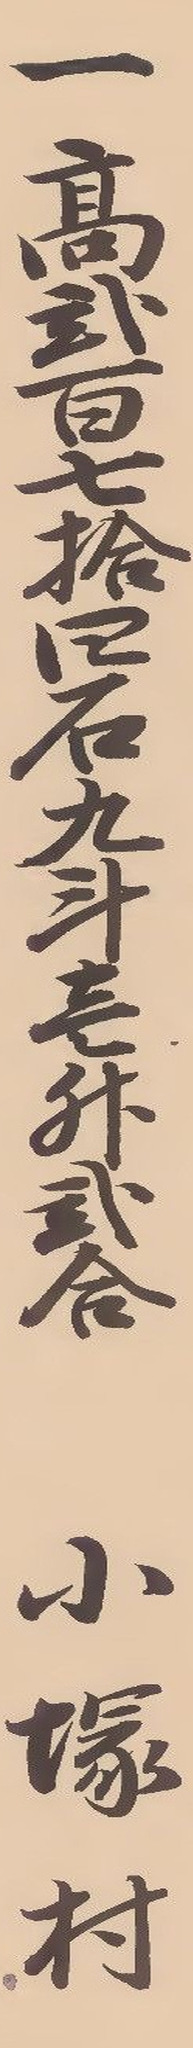一高弐百七拾四石九斗壱升弐合小塚村
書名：相模国郷帳
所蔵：国立公文書館 National Archives of Japan
